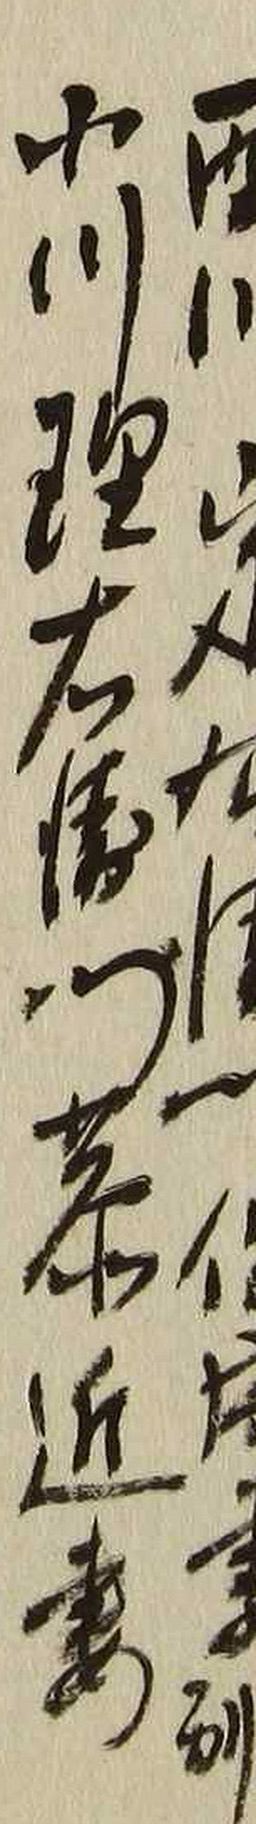小川理右衛門恭近妻
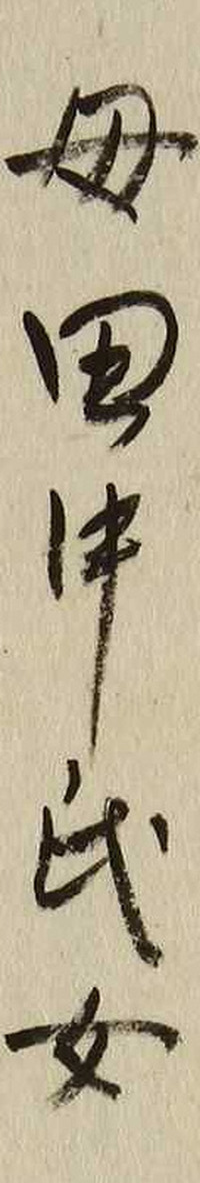母田中氏女
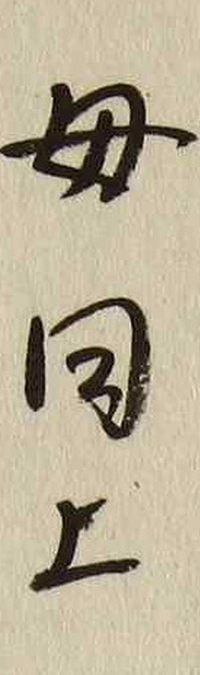母同上
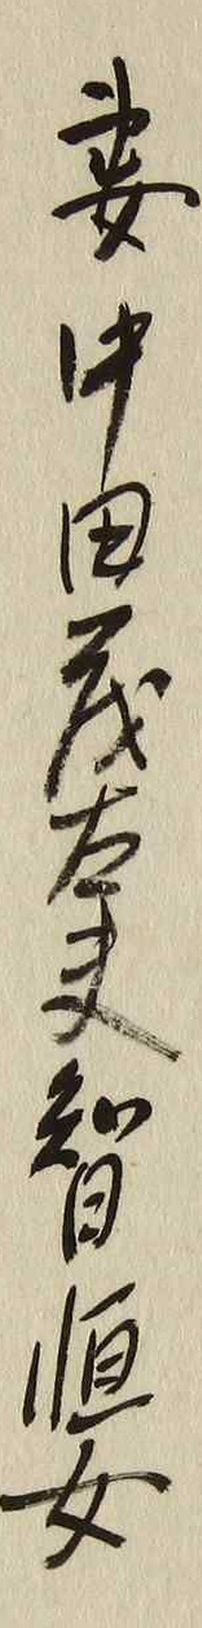妻中田茂太夫智恒女
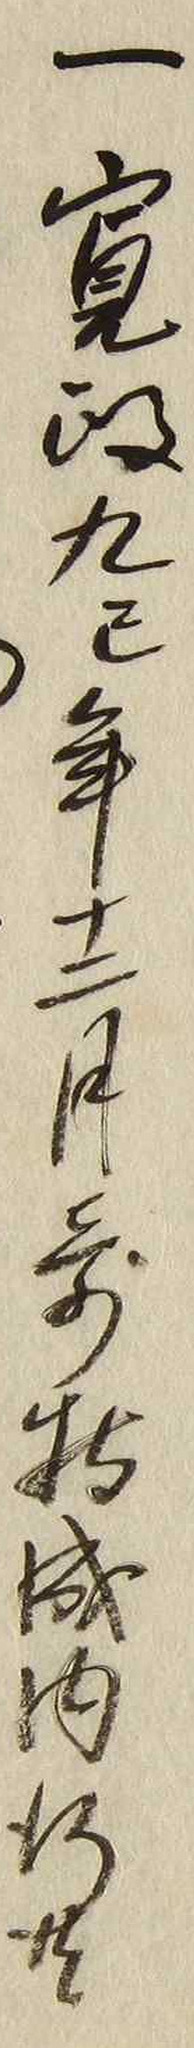一寛政九巳年十二月奇特成内行共
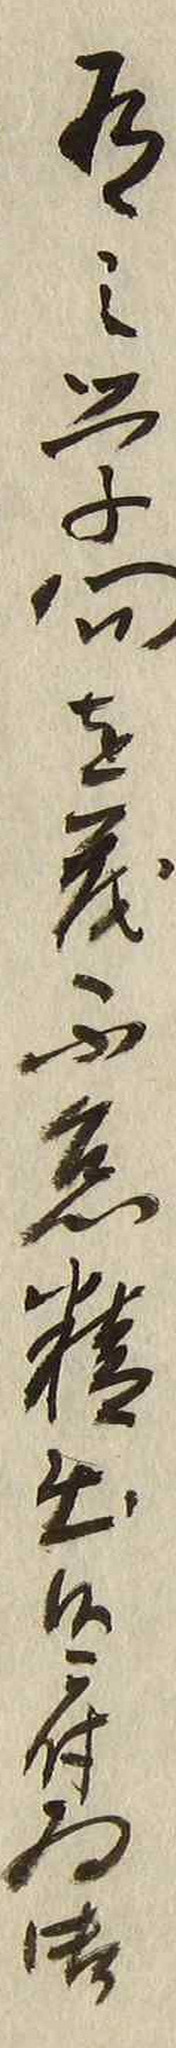有之学問を茂不怠精出候ニ付為御
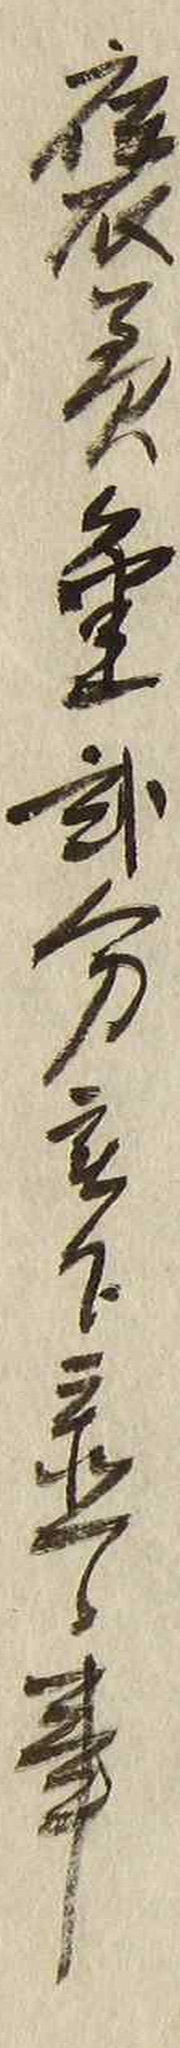褒美金弐分被下置候事

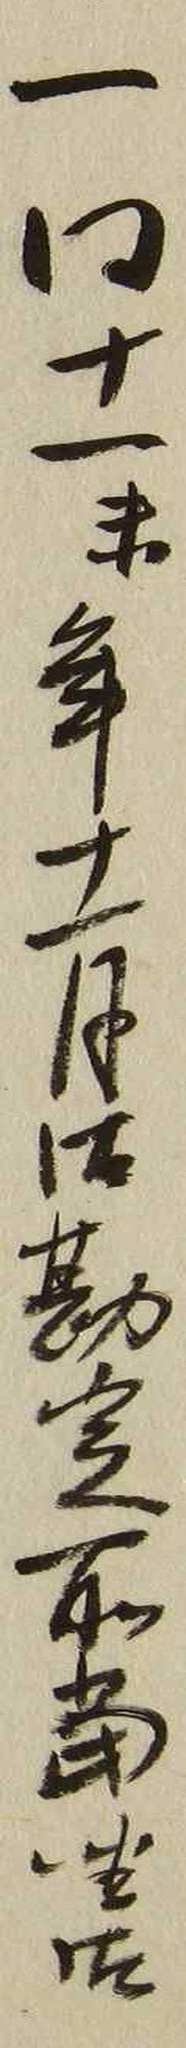一同十一未年十一月御勘定所当坐御
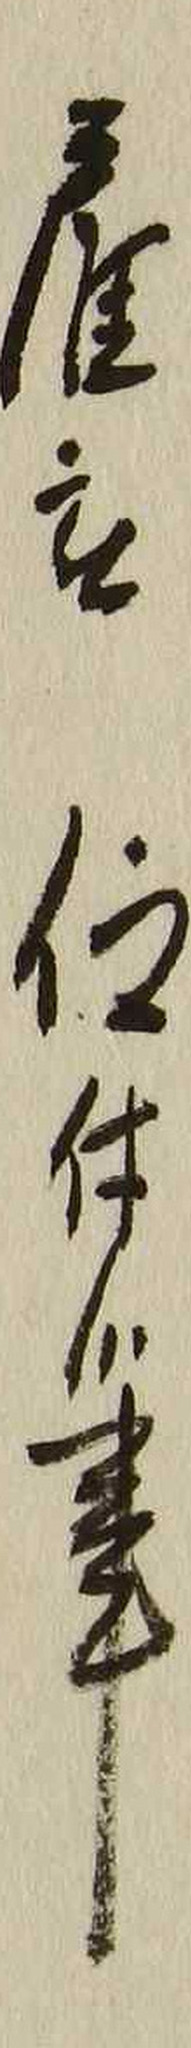雇被仰付候事
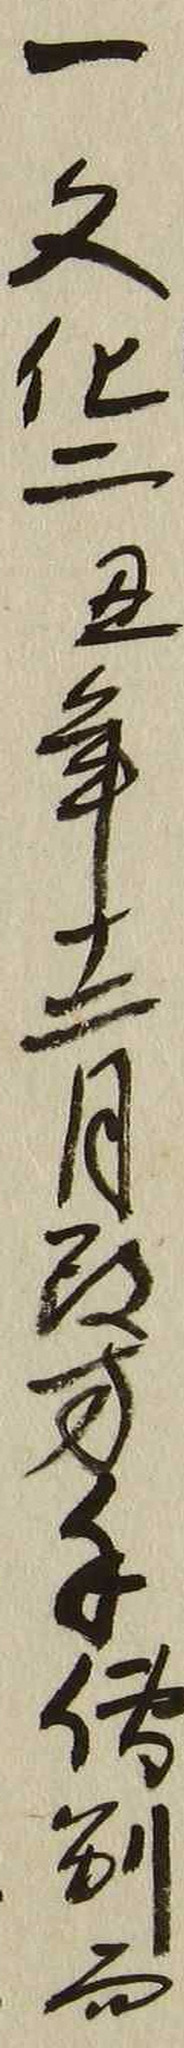一文化二丑年十二月頭方手伝別而
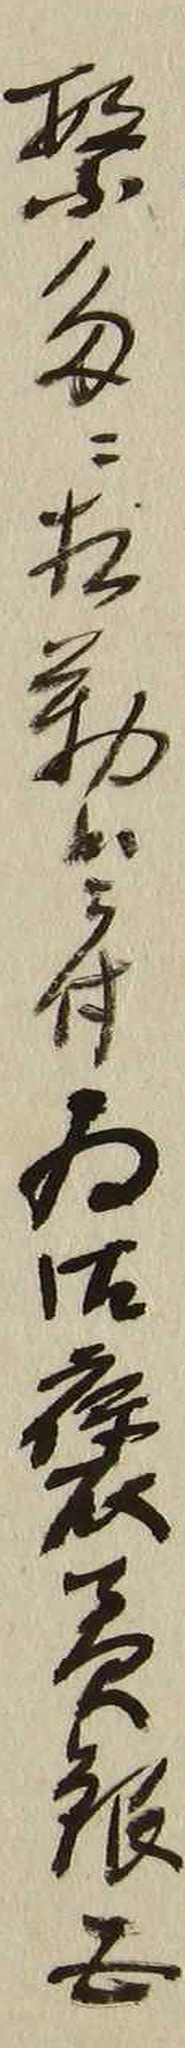繁多ニ相勤候ニ付為御褒美銀五
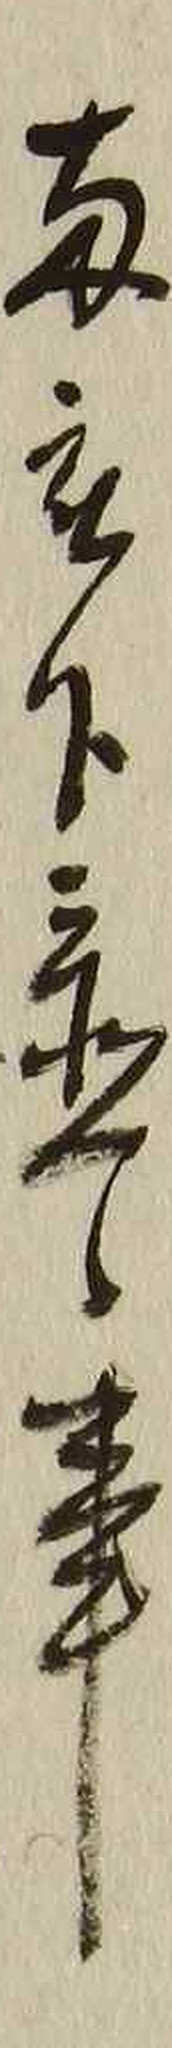両被下置候事
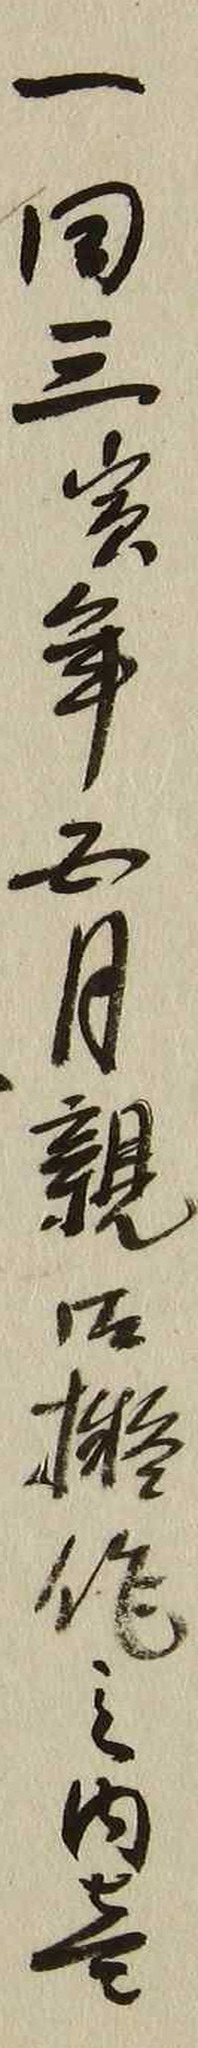一同三寅年五月親御擬作之内壱
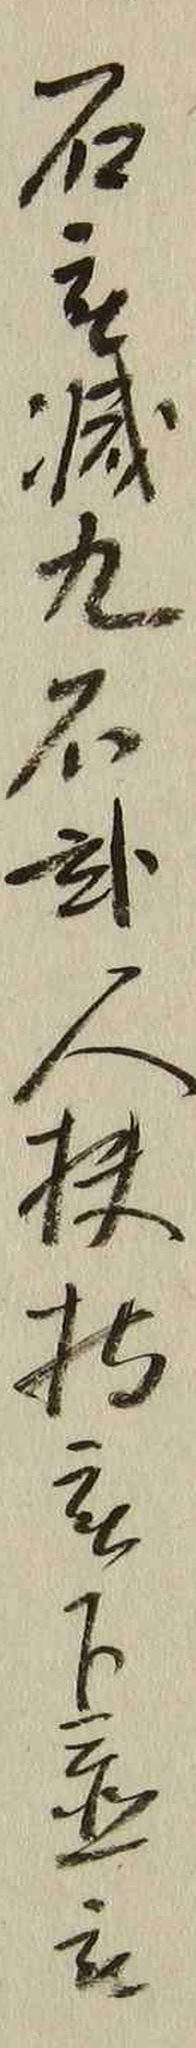石被減九石弐人扶持被下置被
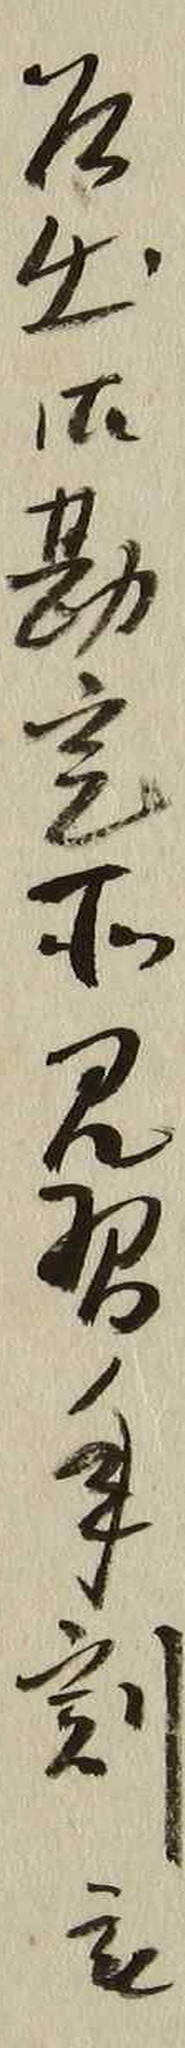召出御勘定所見習年割被
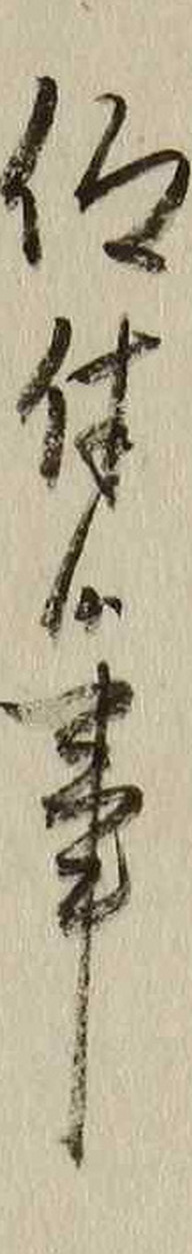仰付候事
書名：諸士系譜　巻之353　す之部3
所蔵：会津若松市立会津図書館
